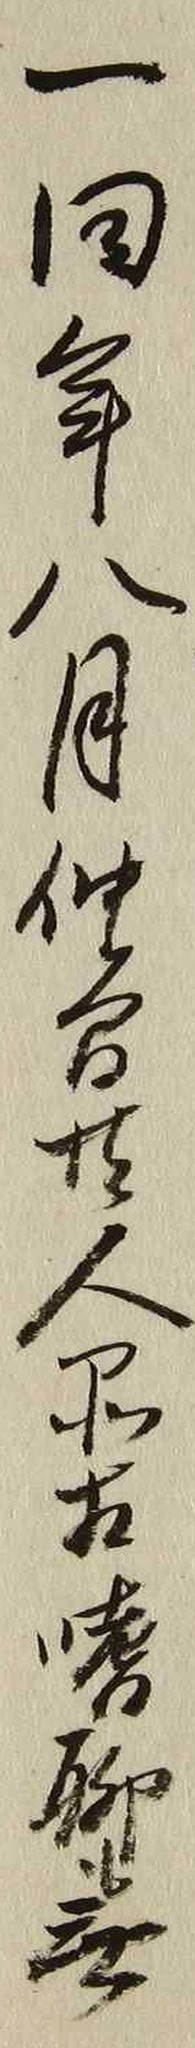一同年八月仲ケ間共人品相嗜聊も無
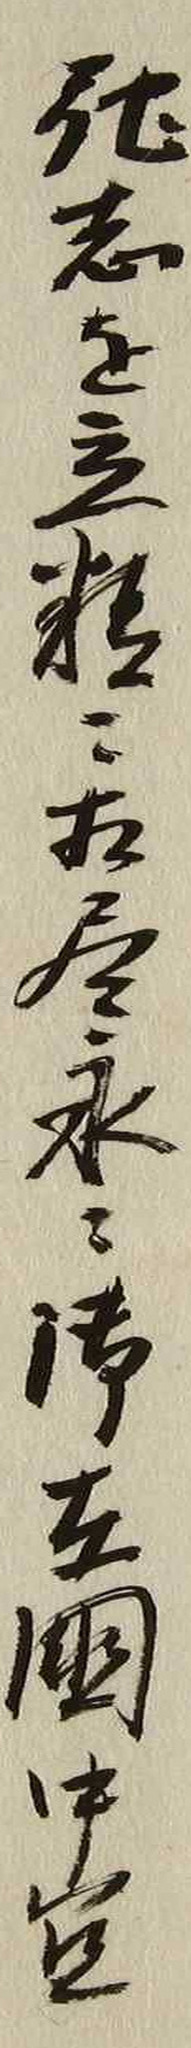弛志を立精々相尽永々御在国中宜
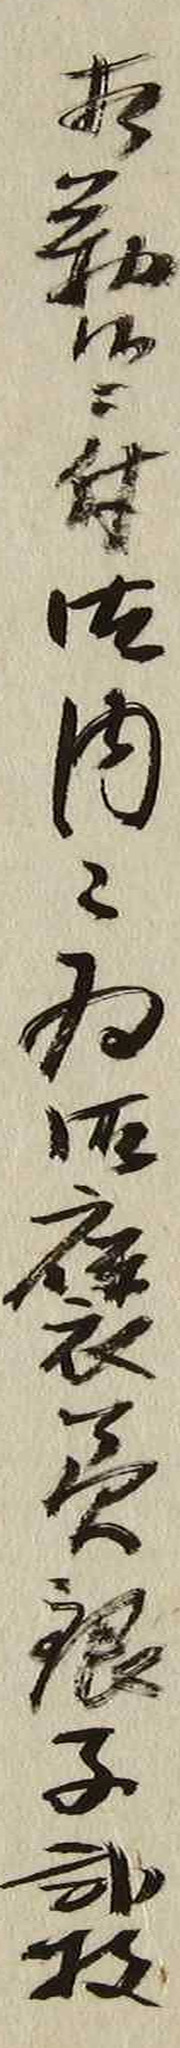相勤候ニ付御内々為御褒美銀子弐枚
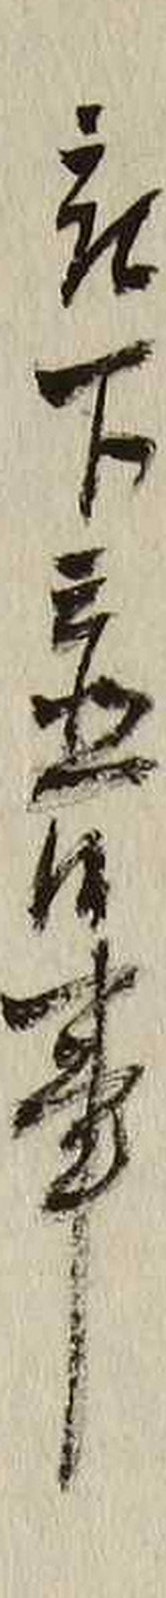被下置候事
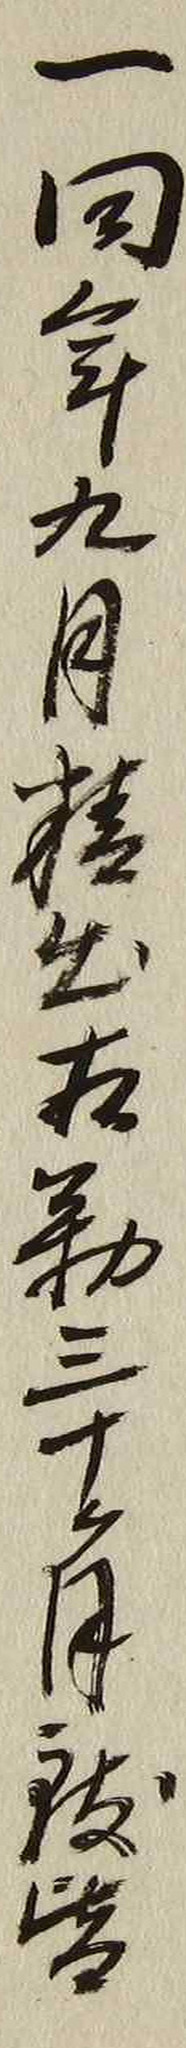一同年九月精出相勤三十ケ月致皆
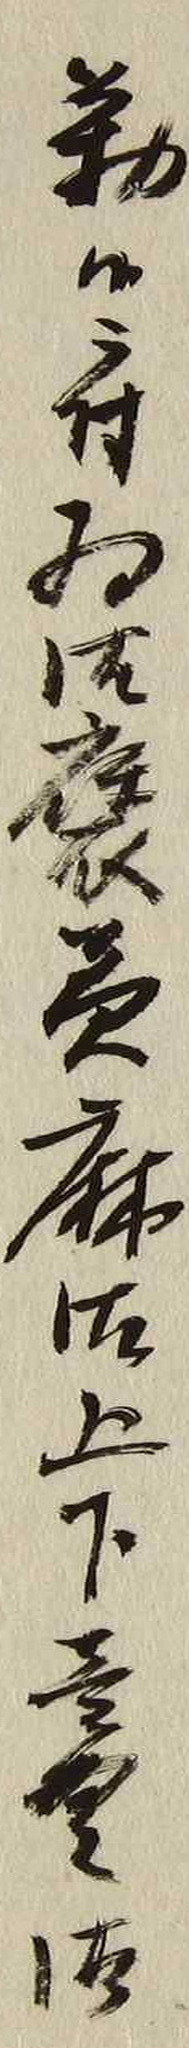勤候ニ付為御褒美麻御上下壱具御
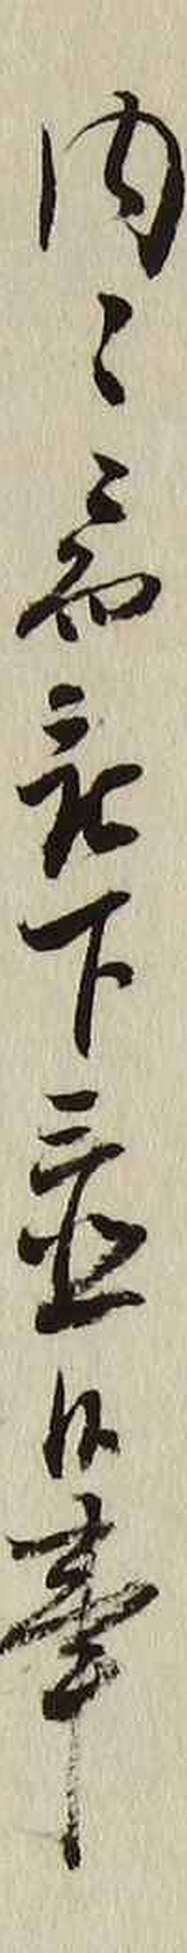内々ニ而被下置候事
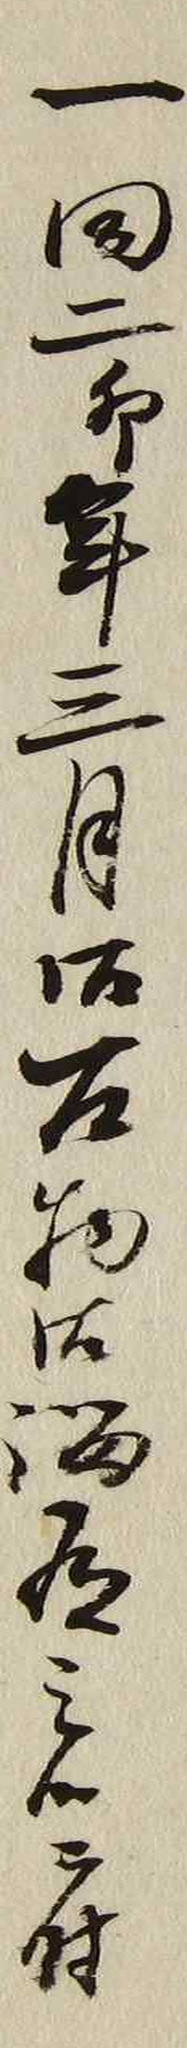一同二卯年三月御召物御溜有之候ニ付
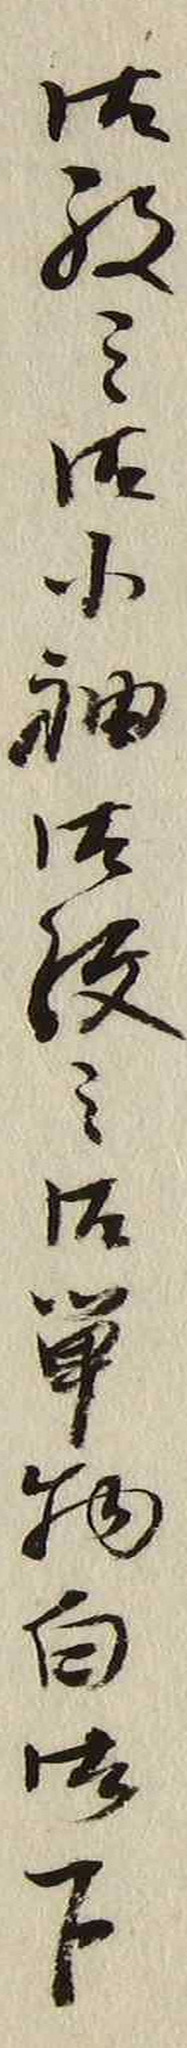御紋之御小袖御紋之御単物白御下
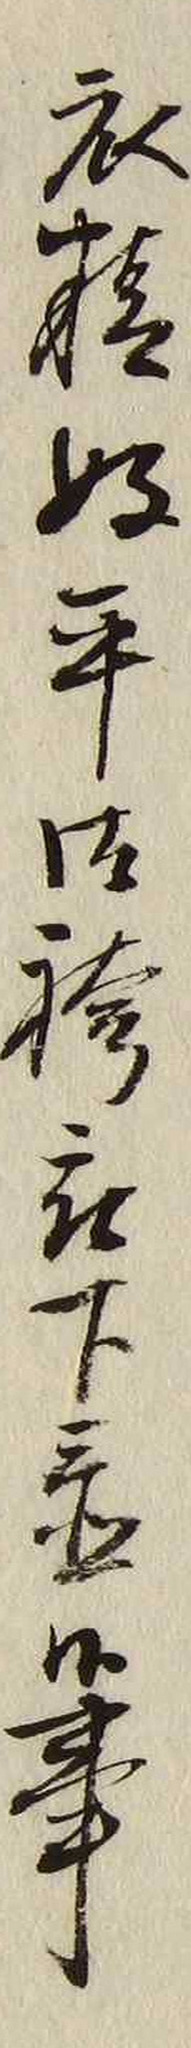衣精好平御袴被下置候事
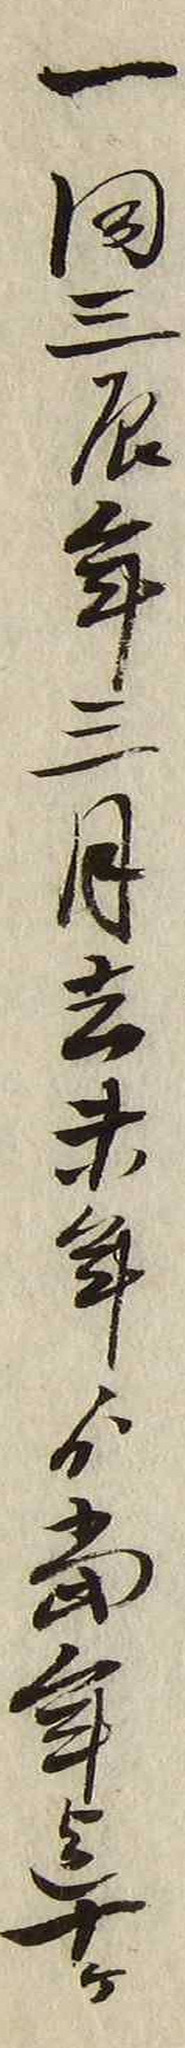一同三辰年三月去未年ゟ当年迄十ケ

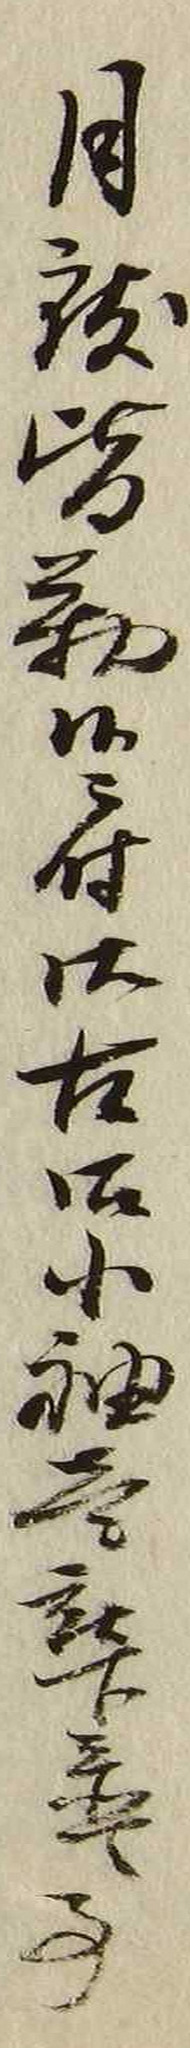月致皆勤候ニ付御古御小袖壱被下置候事
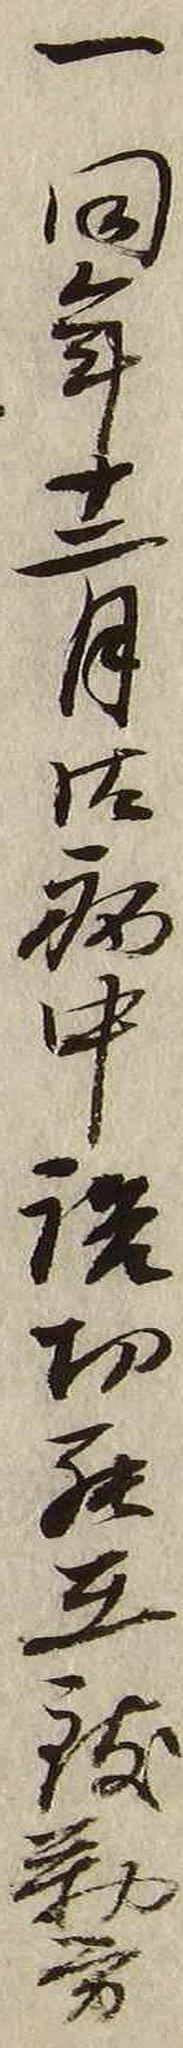一同年十二月御病中詰切罷在致勤労
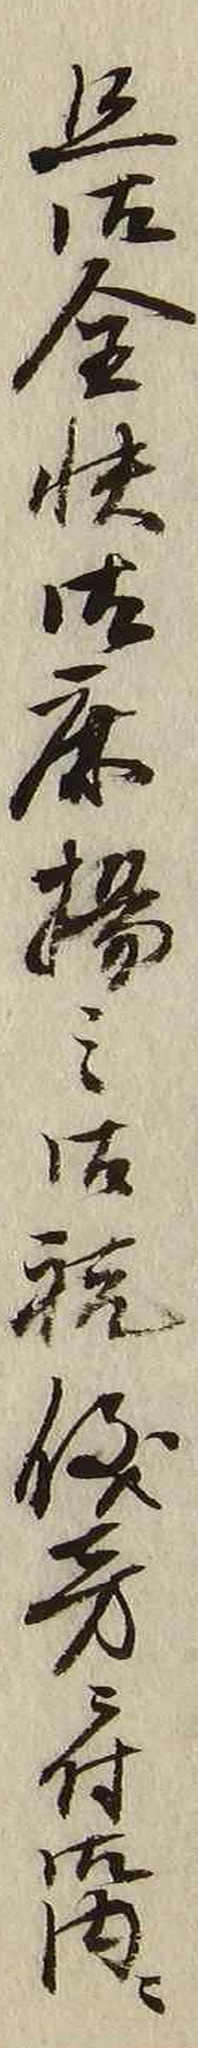且御全快御床揚之御祝儀旁ニ付御内々
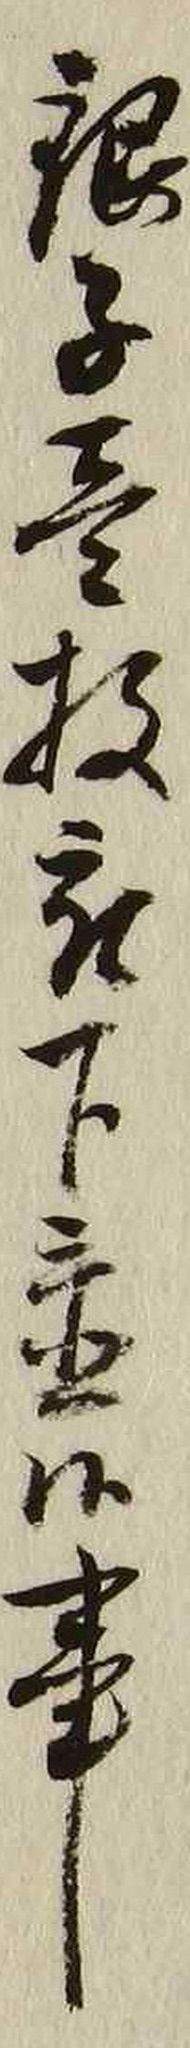銀子壱枚被下置候事
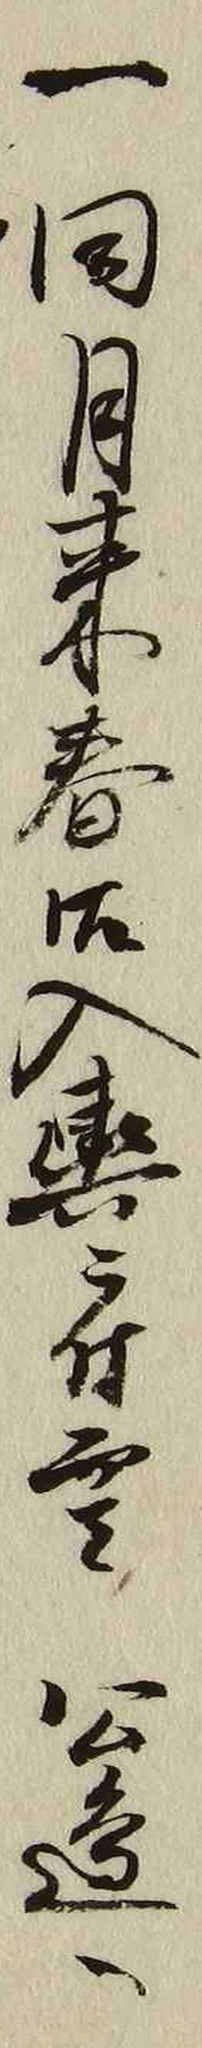一同月来春御入輿ニ付而者公辺へ
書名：諸士系譜　巻之356　す之部6
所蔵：会津若松市立会津図書館
